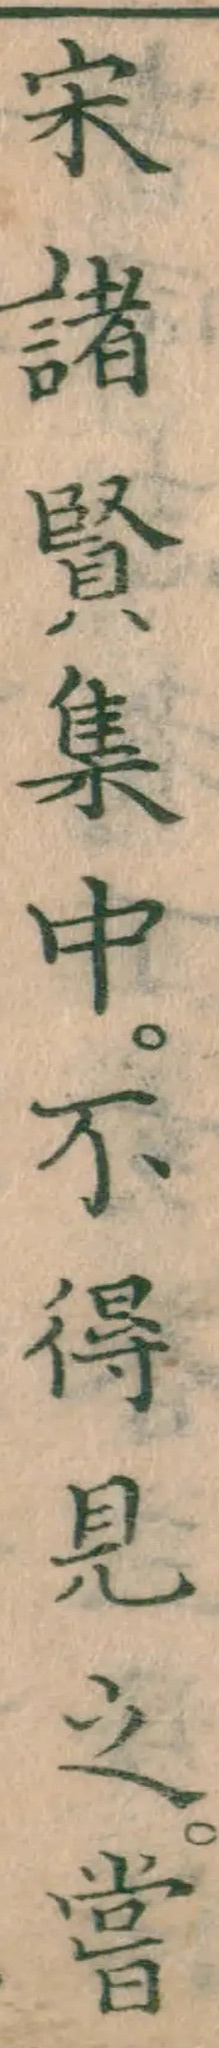宋諸賢集中。不得見之。嘗
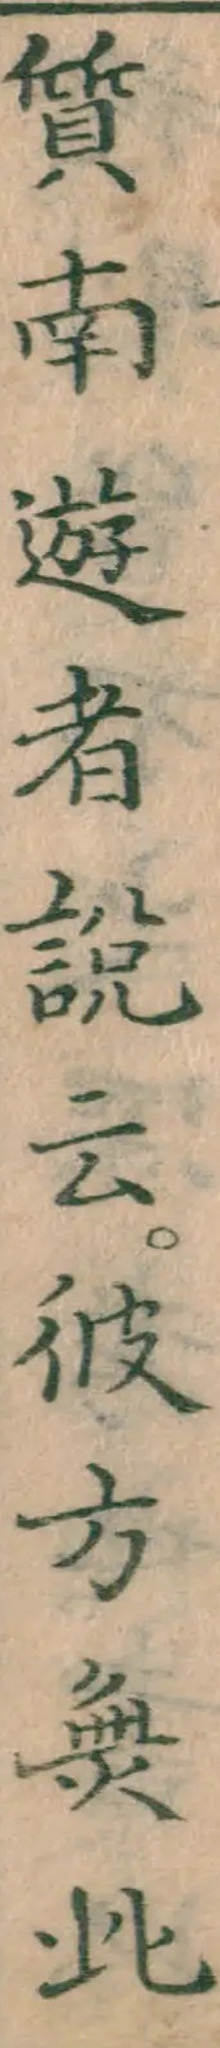質南遊者説云。彼方無此

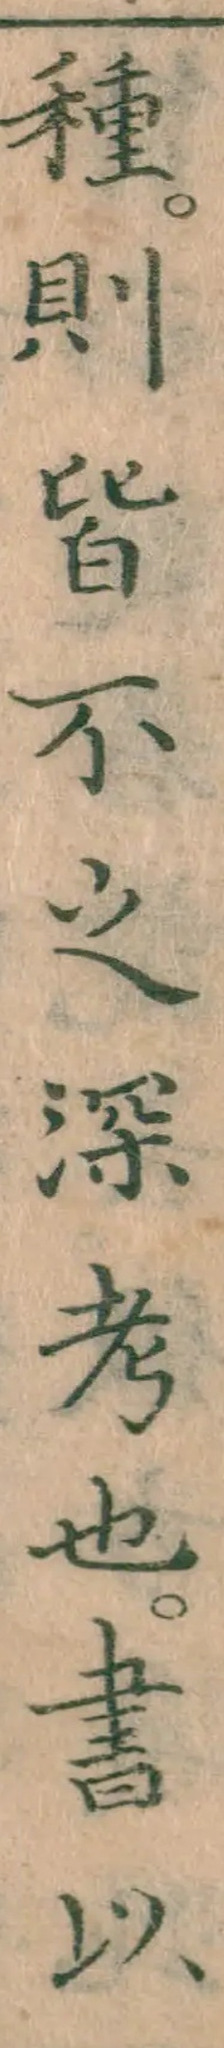種。則皆不之深考也。書以
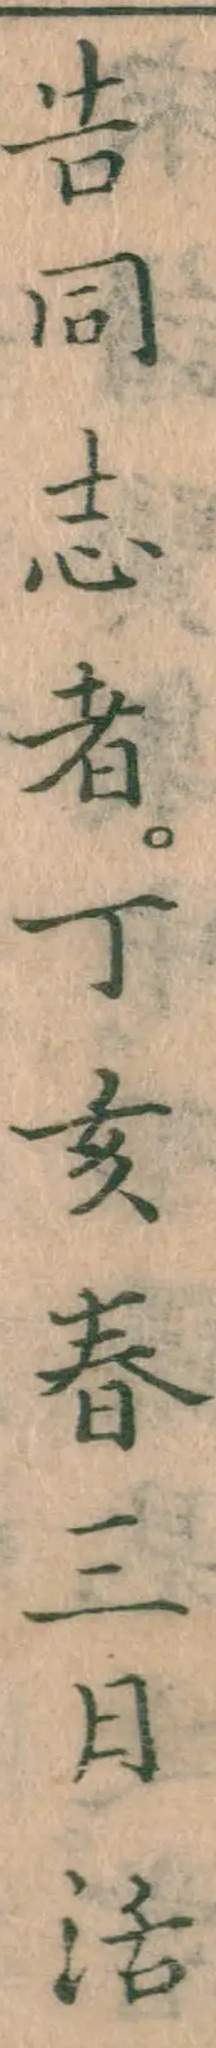告同志者。丁亥春三月活
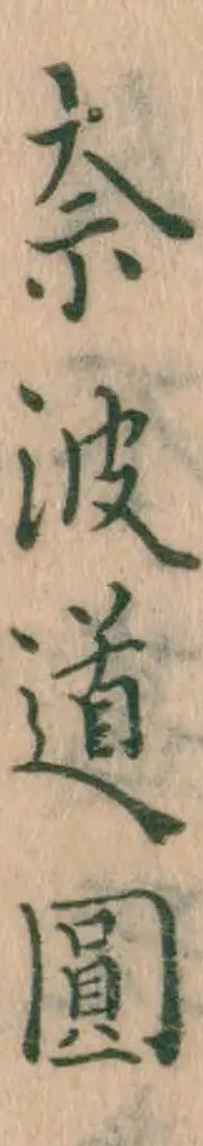奈波道圓
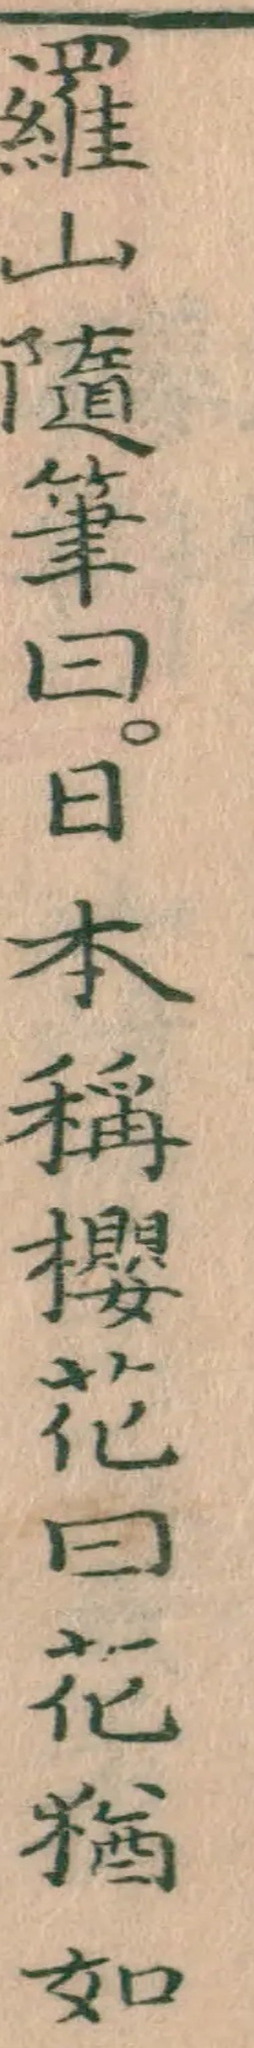羅山随筆曰。日本称桜花曰花猶如
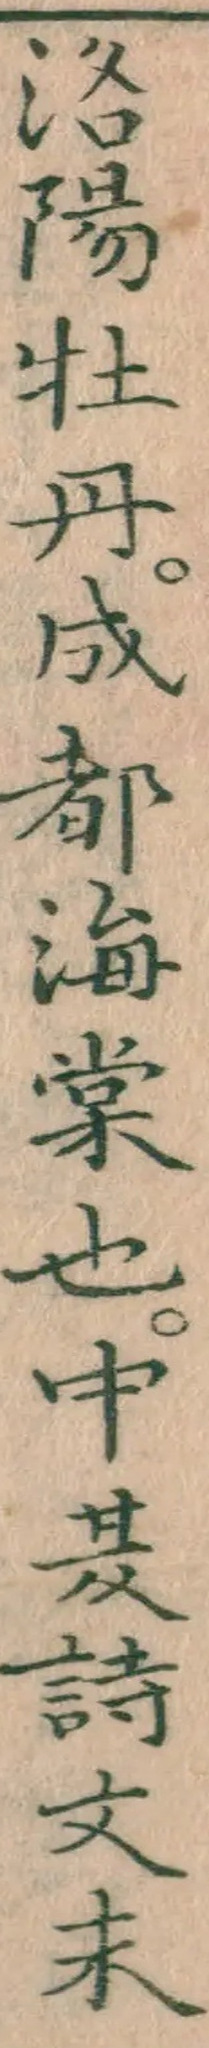洛陽牡丹。成都海棠也。中其詩文末
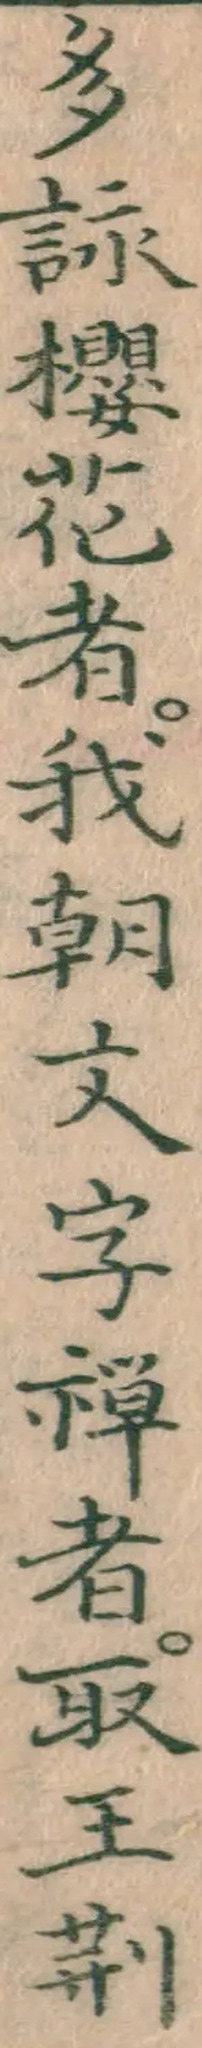多詠桜花者。我朝文字禅者。取王荊
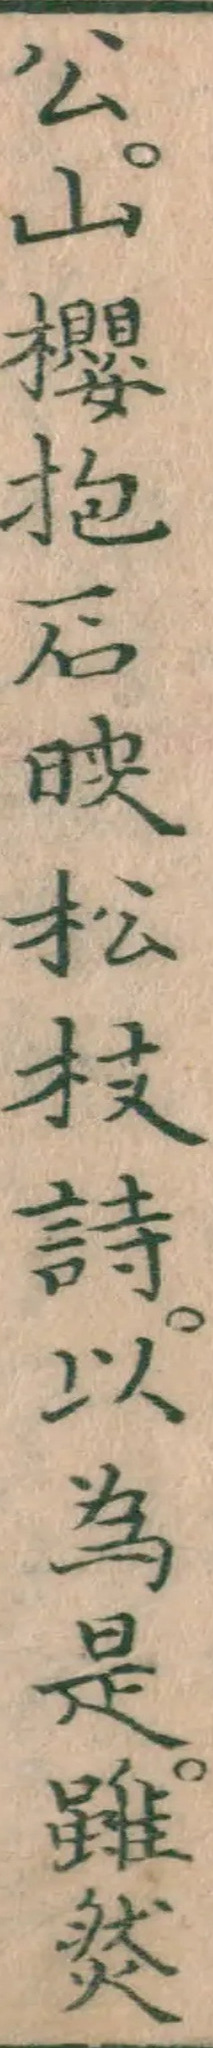公。山桜抱石映松枝詩。以為是。雖然
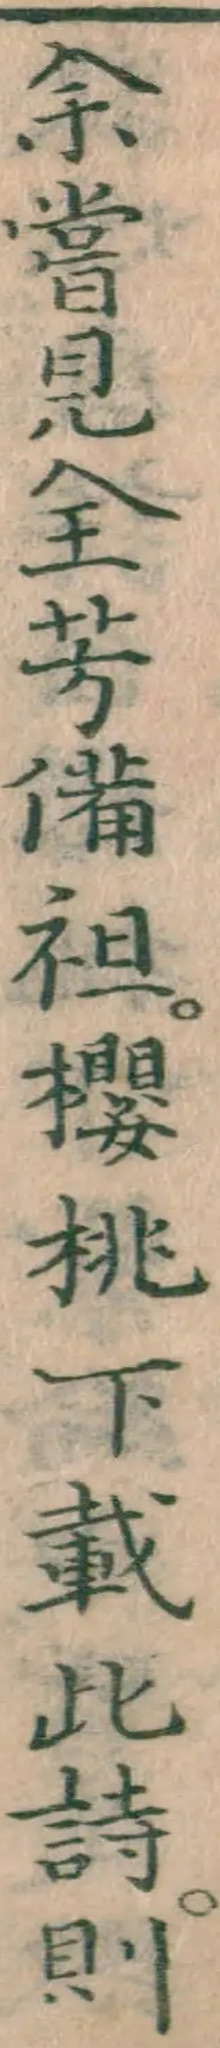余嘗見全芳備袒。桜桃下載此詩。則
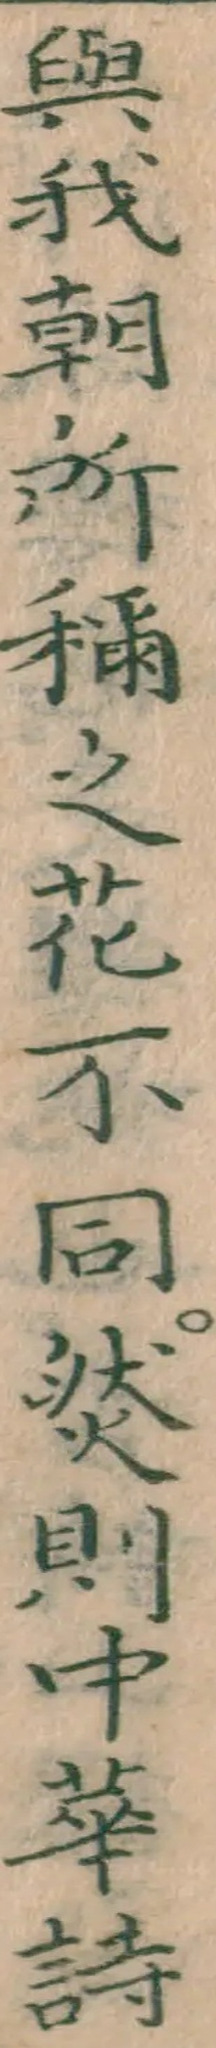与我朝所称之花不同。然則中華詩

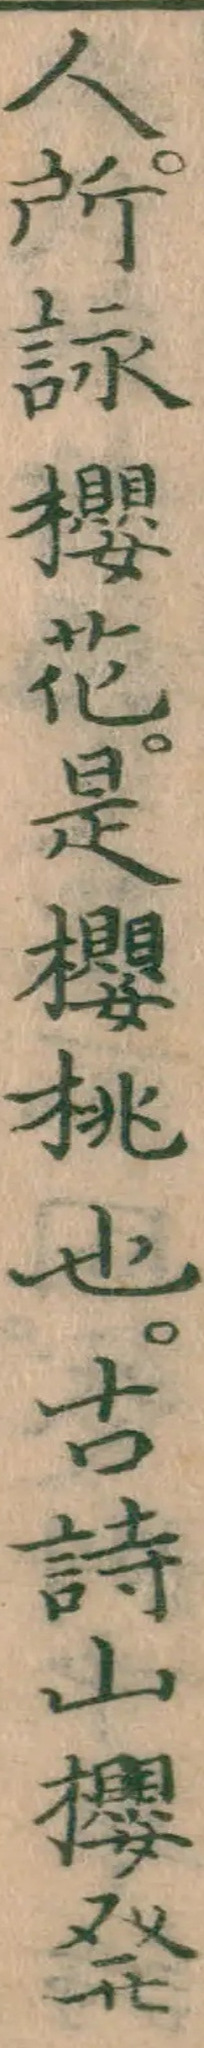人。所詠桜花。是桜桃也。古詩山桜発
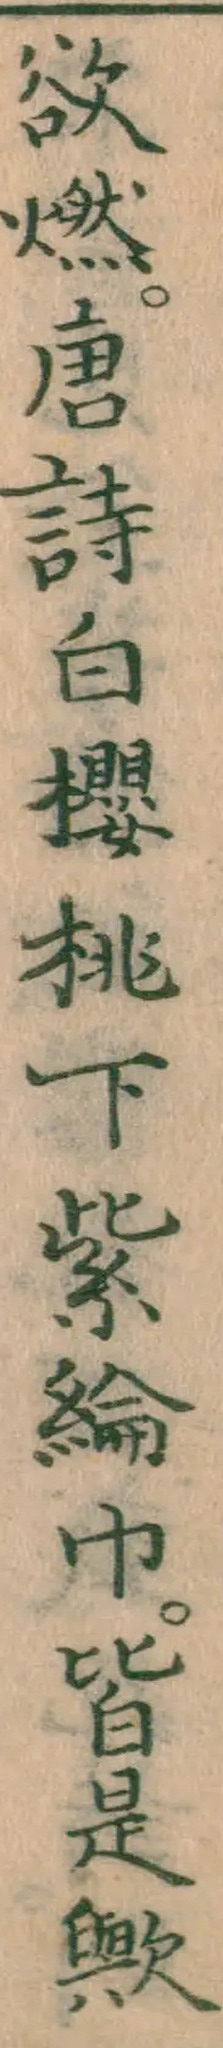欲燃。唐詩白桜桃下紫綸巾。皆是歟
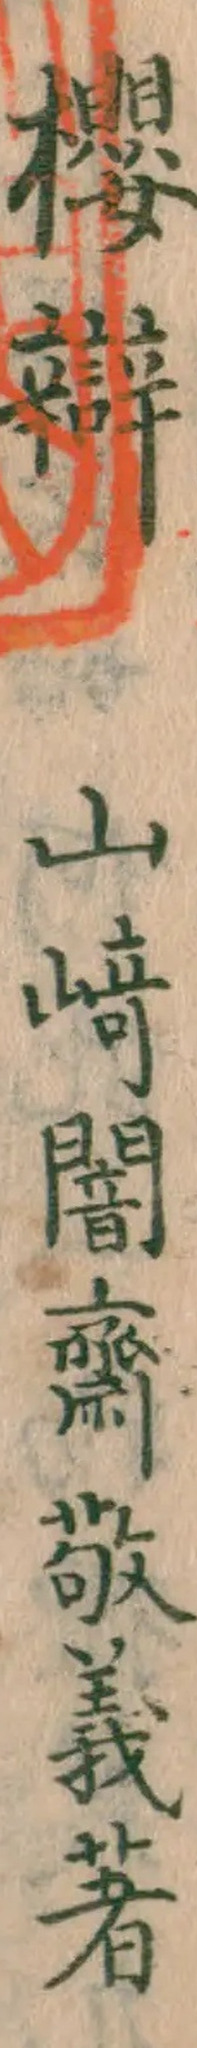桜弁山崎闇斎敬義著
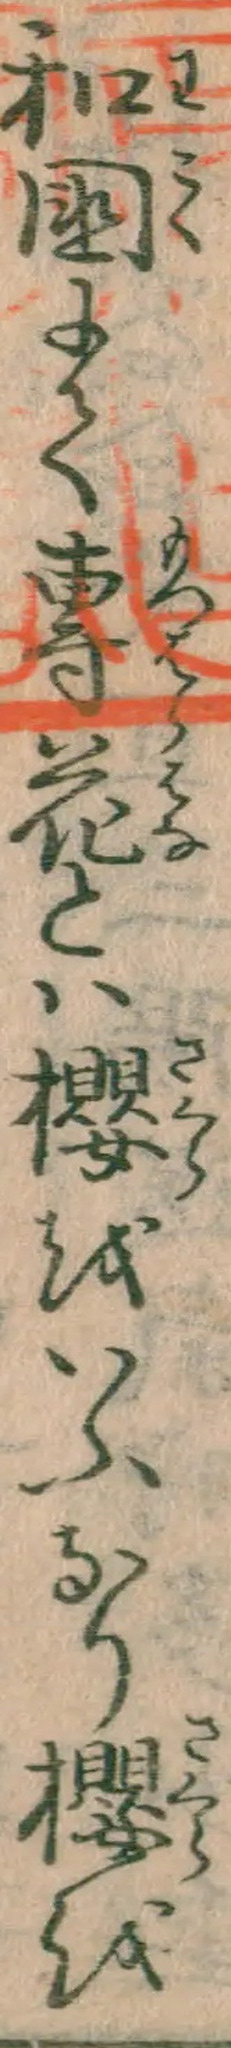和国にて専花とは桜をいふなり桜を
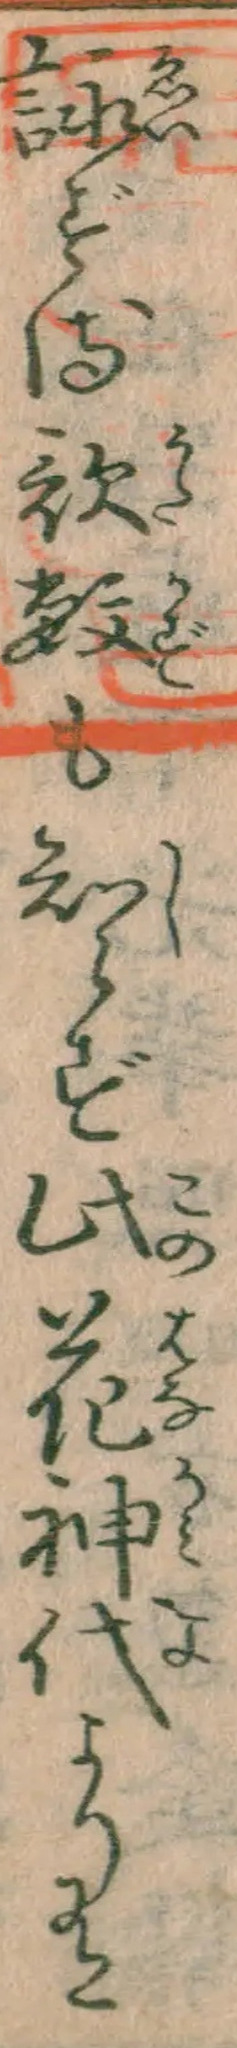詠ずる歌数も知らず此花神代より有
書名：怡顔齋櫻品
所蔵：国立国会図書館 National Diet Library, JAPAN
